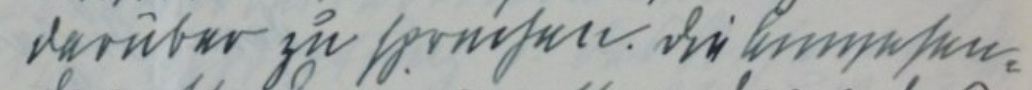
darüber zu sprechen. Die bennanten
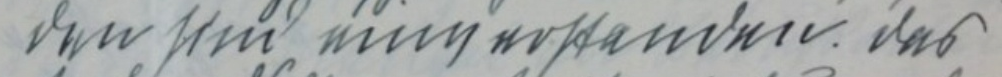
den sind eine erstanden das
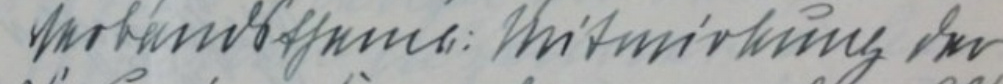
Verbandsthema: Mitwirkung der
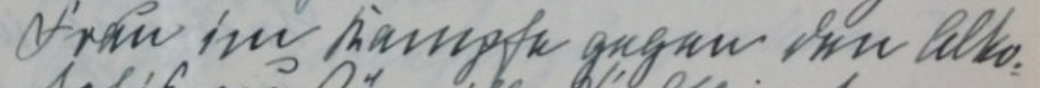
Frau im Kapfe gegen den Alko
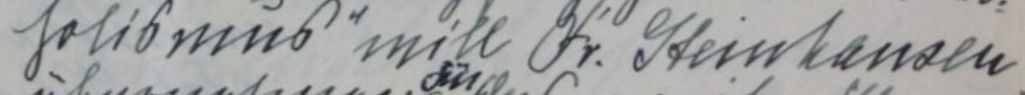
holismus" will Fr. Steinhausen
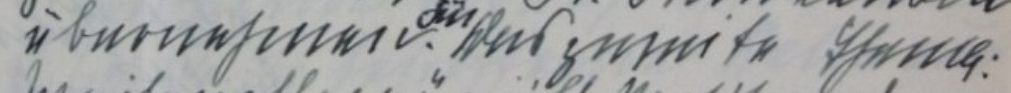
ünernehmen. Das zweite Thema
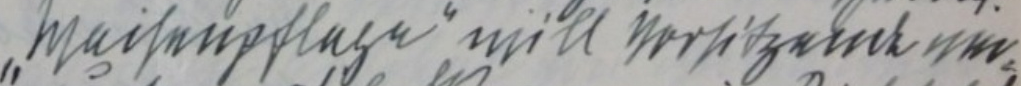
„Waisenpflege" will Vorsitzende ver
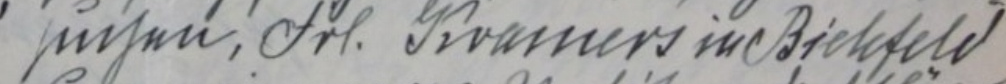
siuchen, Frl. Kramer in Bielefeld
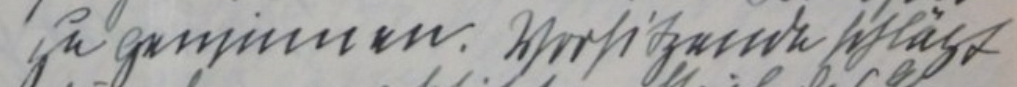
zu gewinnen. Vorsitzende schlägt
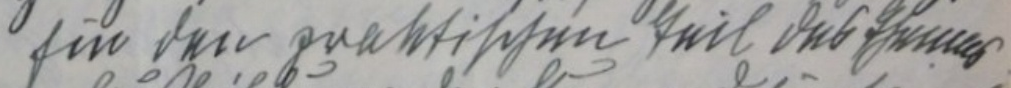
für den praktischen Teil des Themas
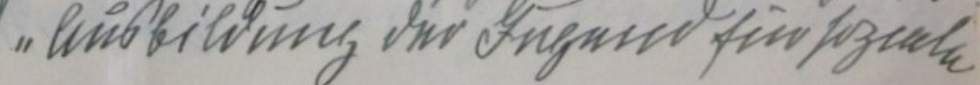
„Ausbildung der Jugend für soziale
